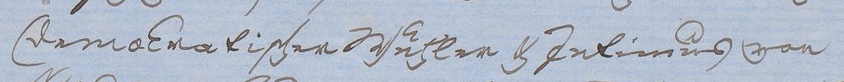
(demokratischer Wühler & Intimus von
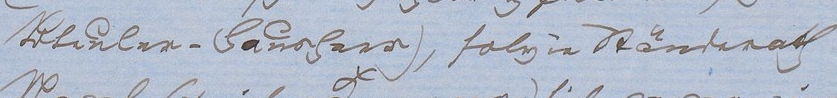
Bleuler-Hausheer ), sowie Ständerath
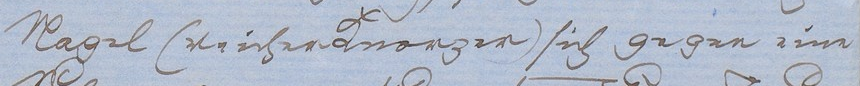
Nagel (reicher Knorzer), sich gegen eine
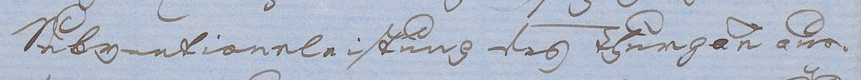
Subventionsleistung des Thurgau aus-
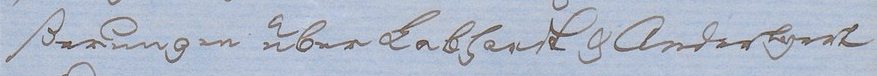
ßerungen über Labhardt & Anderwert
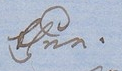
thun.
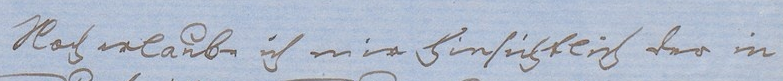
Noch erlaube ich mir hinsichtlich der in
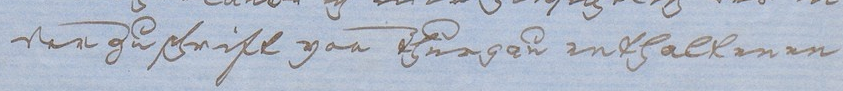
der Zuschrift von Thurgau enthaltenen
